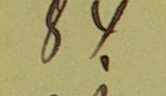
84
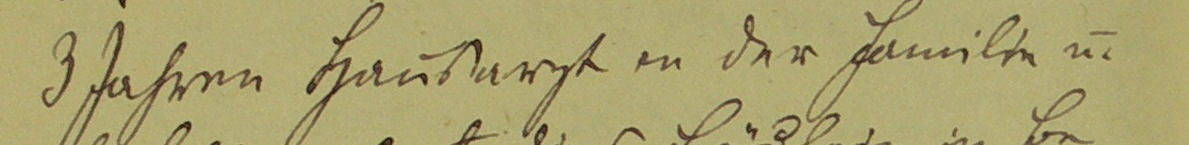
3 Jahren Hausarzt in der Familie und
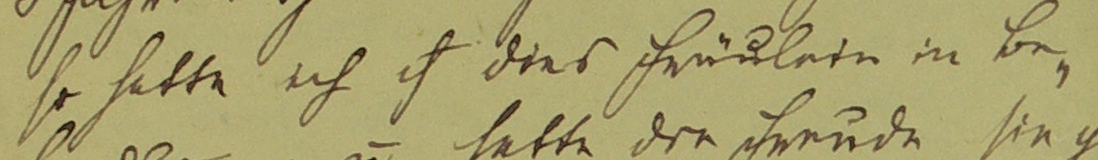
so hatte ich auch dies Fräulein in Be¬
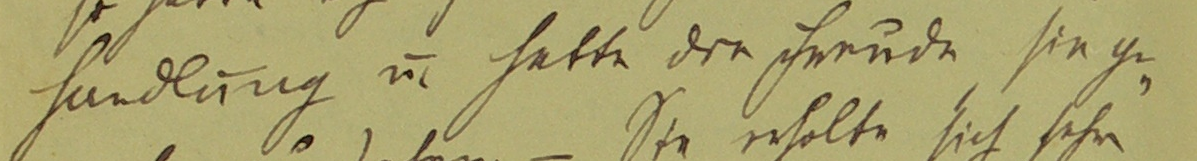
handlung und hatte die Freude sie ge¬
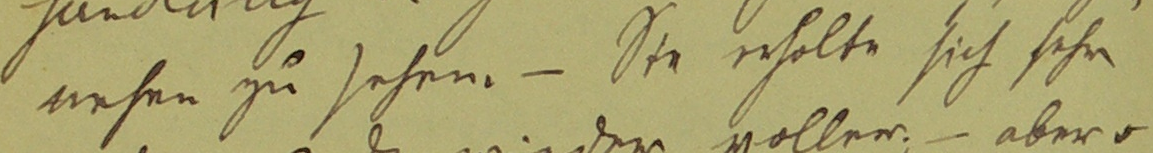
nesen zu sehen.-Sie erholte sich sehr
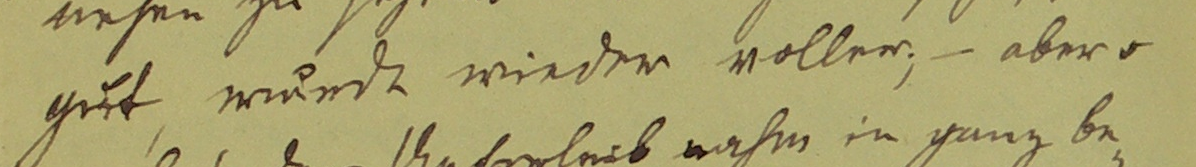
gut , wurde wieder voller;- aber o
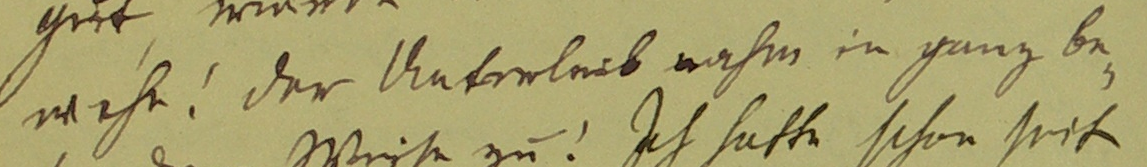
weh! Der Unterleib nahm in ganz be¬
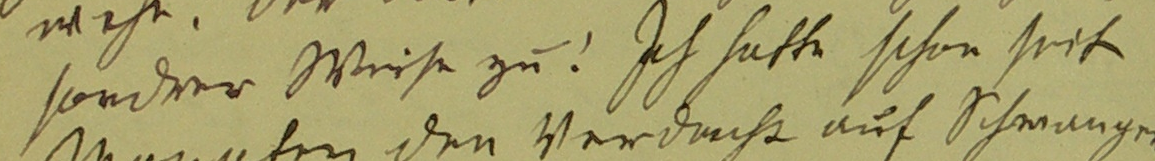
sonderer Weise zu,- Ich hatte schon seit
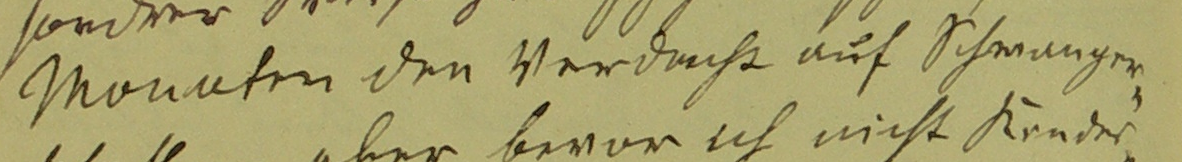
Monaten den Verdacht auf Schwanger¬
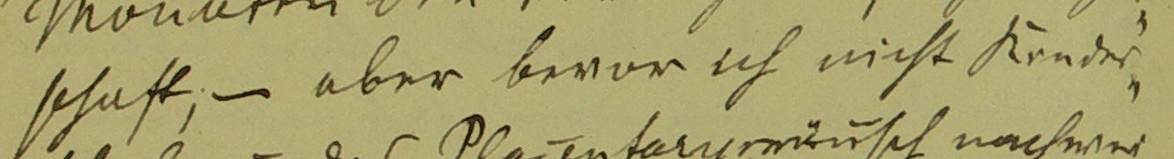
schaft;-aber bevor ich nicht Kindes¬
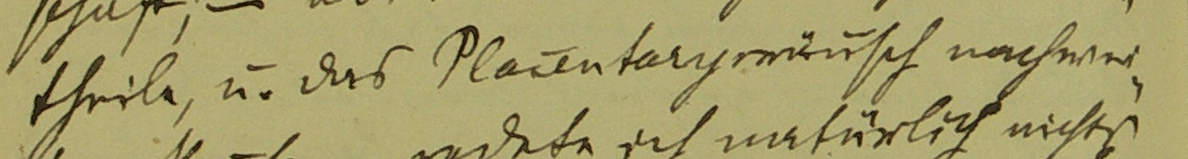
theile, und das Placentargeräusch nachwei¬
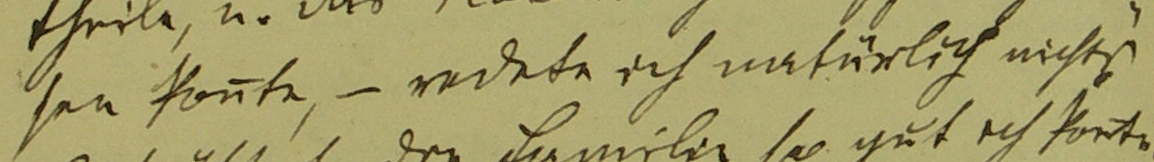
sen konnte ,-redete ich natürlich nicht
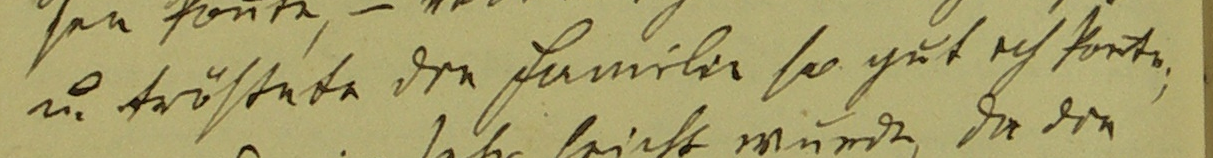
und tröstete die Familie so gut ich konnte
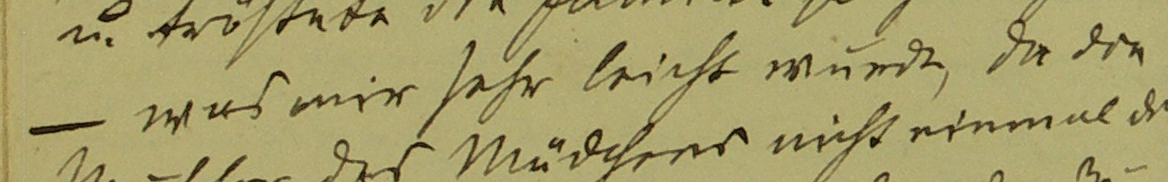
-Was mir sehr leicht wurde, da die
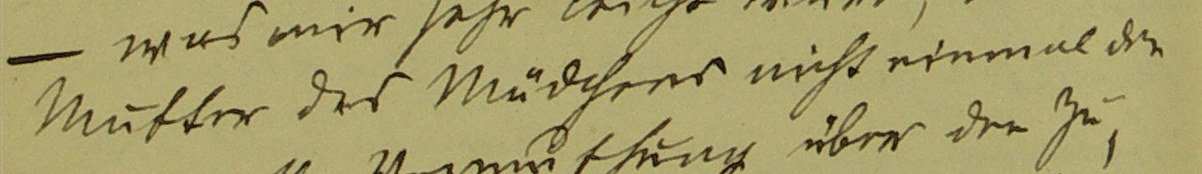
Mutter des Mädchens nicht den einmal die
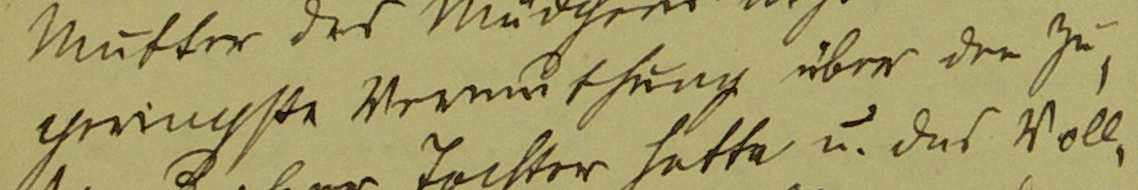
geringste Vermutung über den Zu¬
